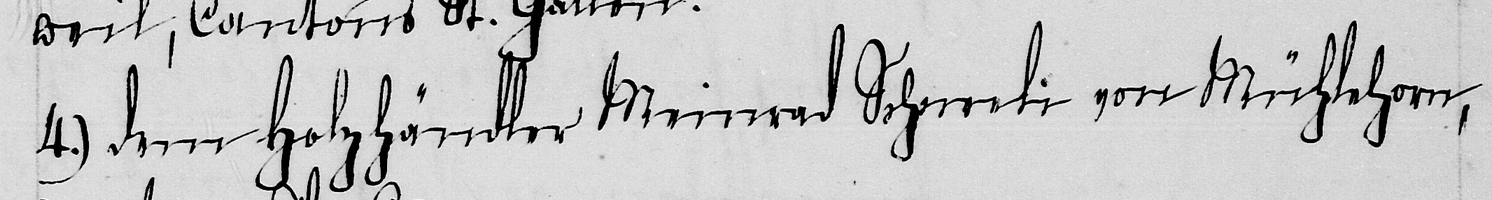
4.) dem Holzhändler Meinrad Schneli von Mühlehorn,
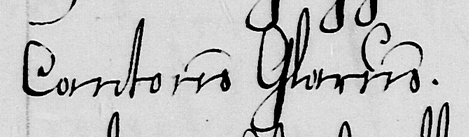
Cantons Glarus.
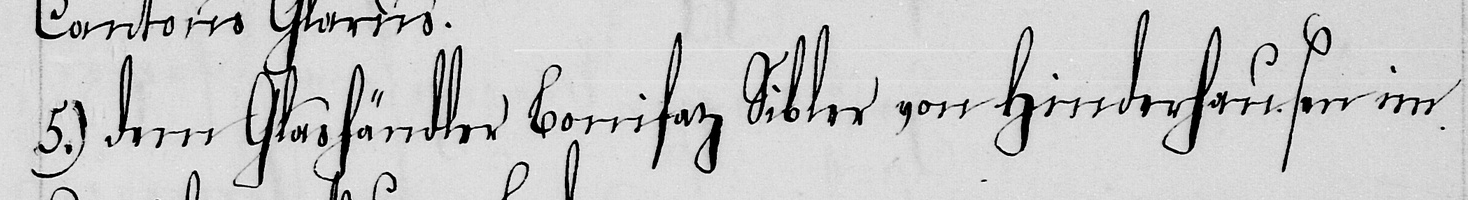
5.) dem Glashändler Bonifaz Sibler von Hinderhausen im
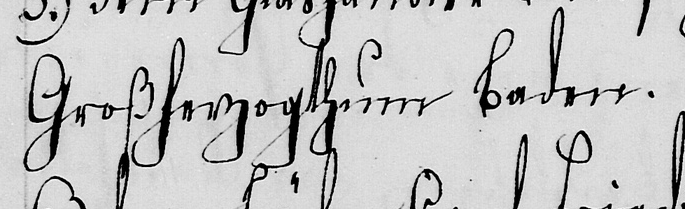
Großherzogthum Baden.
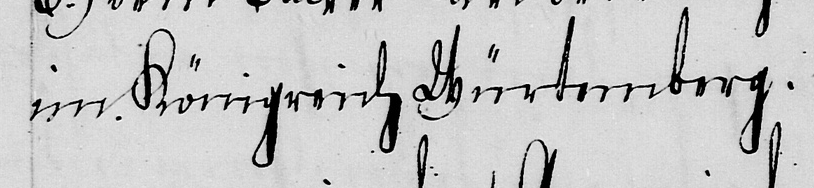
im Königreich Würtemberg.
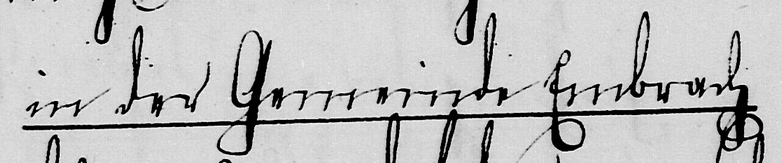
in der Gemeinde Embrach
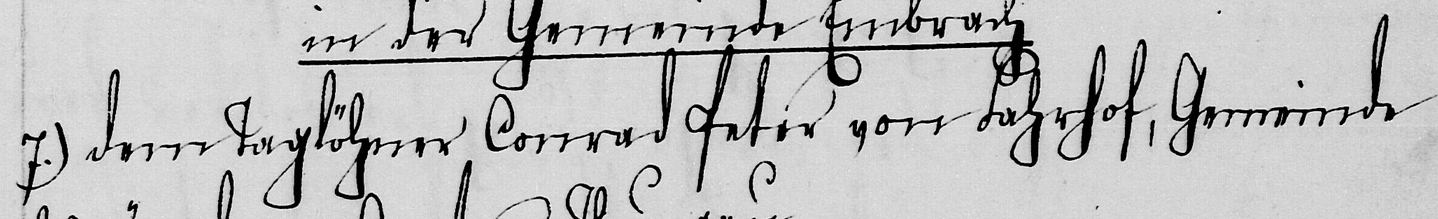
7.) dem Taglöhner Conrad Peter von Fahrhof, Gemeinde
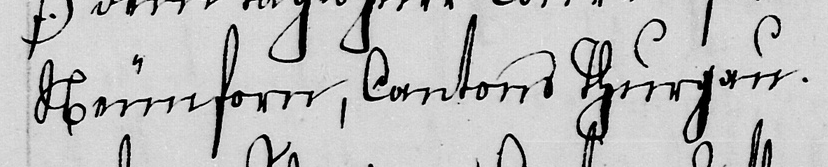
Neunforn, Cantons Thurgau.
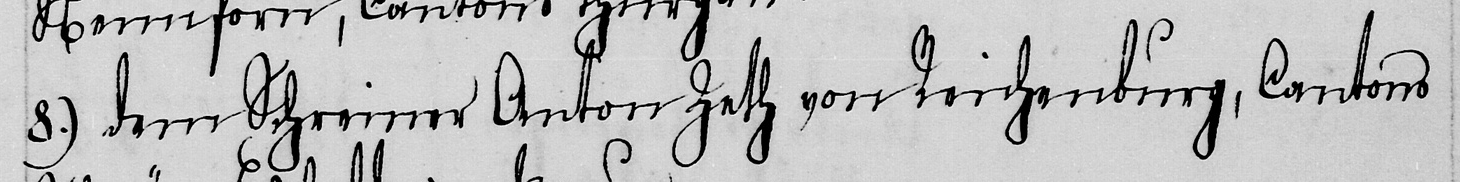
8.) dem Schreiner Anton Zeth von Reichenburg, Cantons
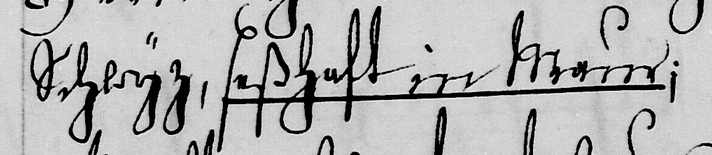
Schwyz, seßhaft in Maur;
